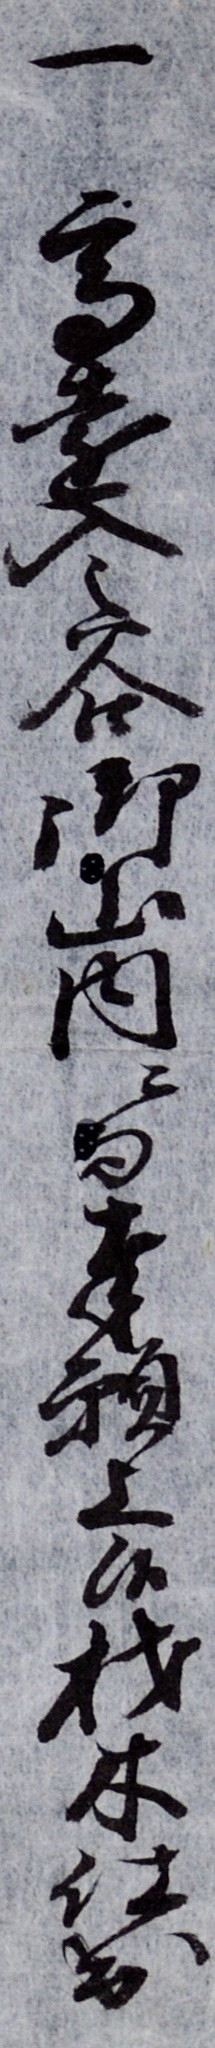一高遠入之谷御山内二而奉願上候材木仕出
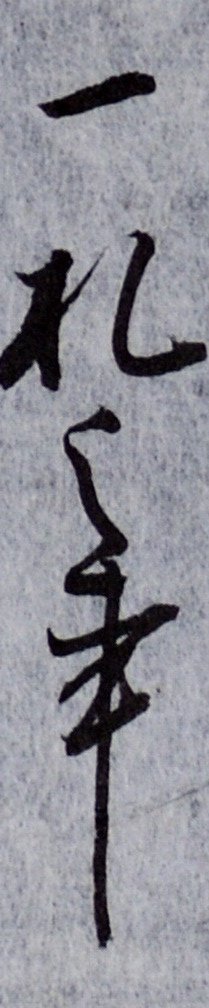一札之事
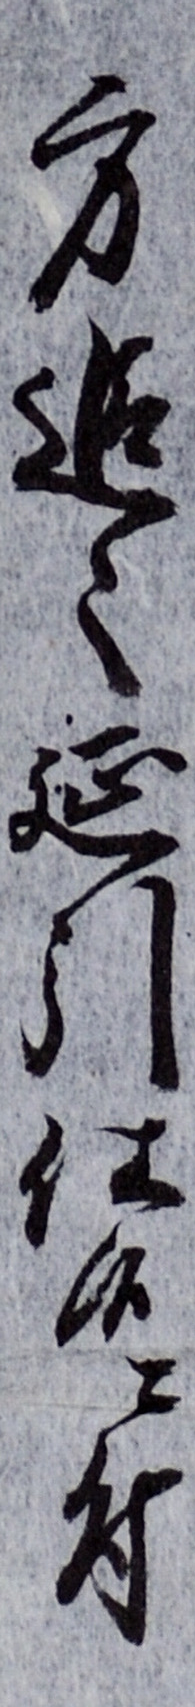方追々延引仕候二付
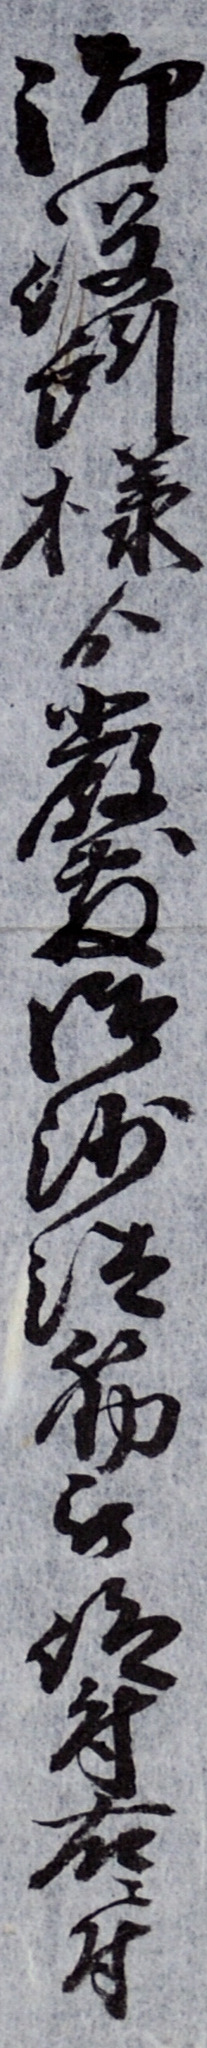御役所様ゟ厳敷御沙汰筋被仰付所二付
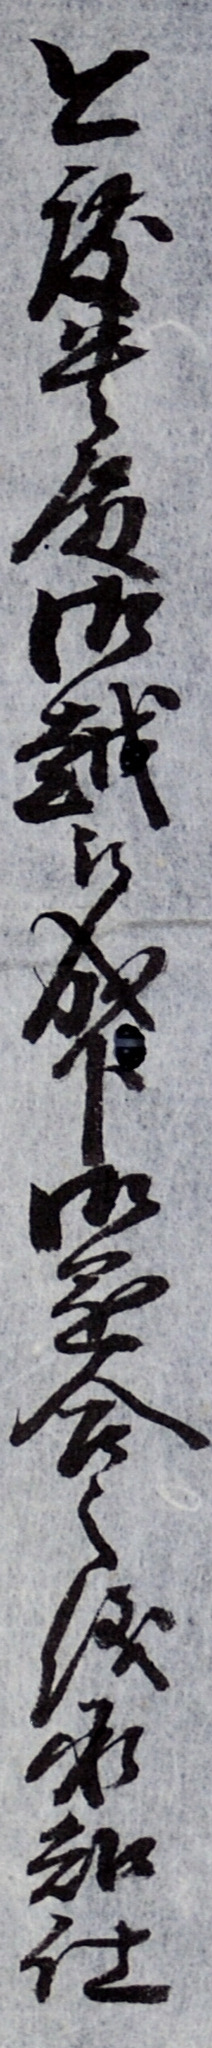今度貴殿御越被成下御懸合之儀承知仕
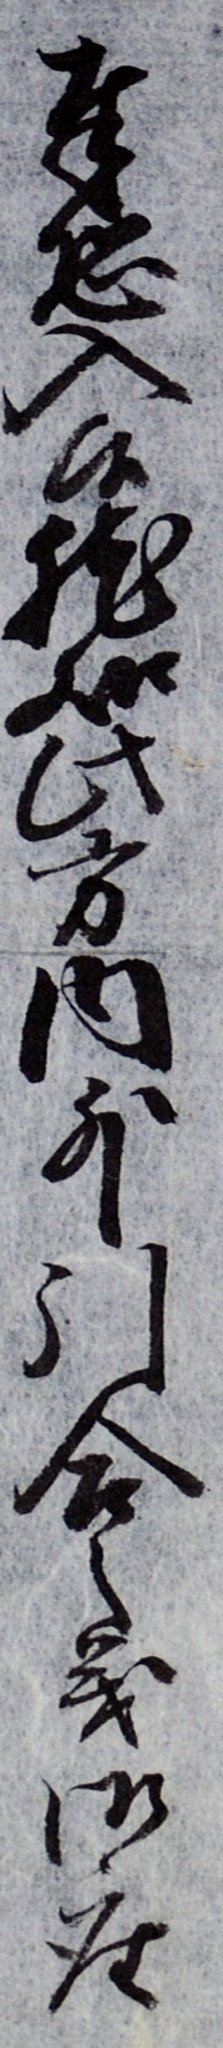奉恐入候然処此方内外引合之義御座
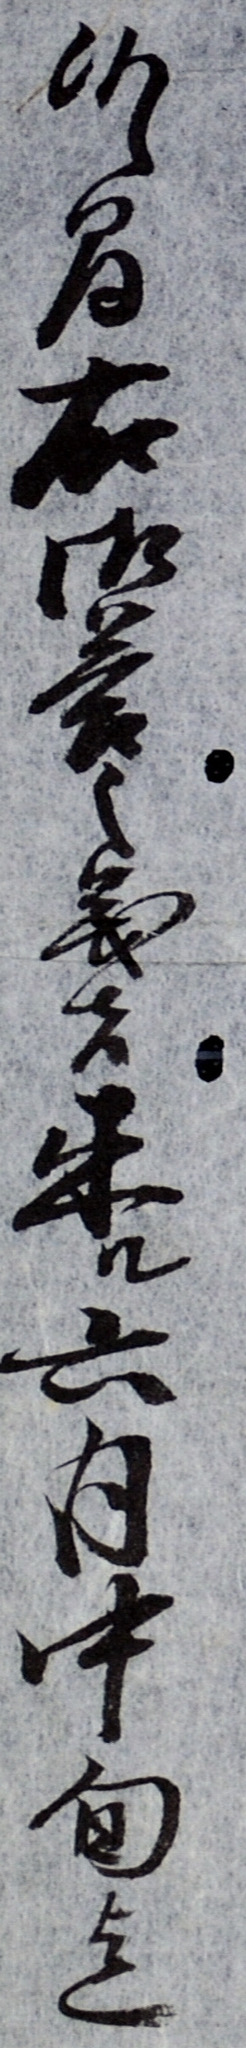候間右御答之義者来ル六月中旬迄
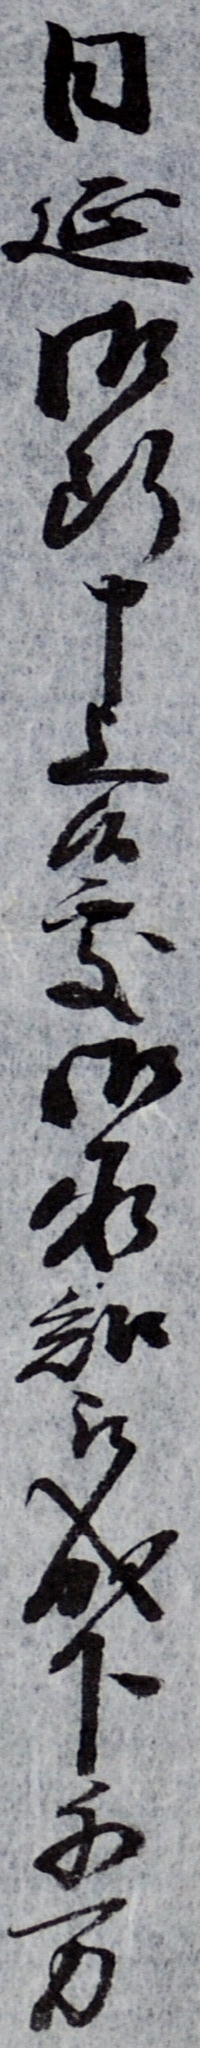日延御断申上候処御承知被成下千万
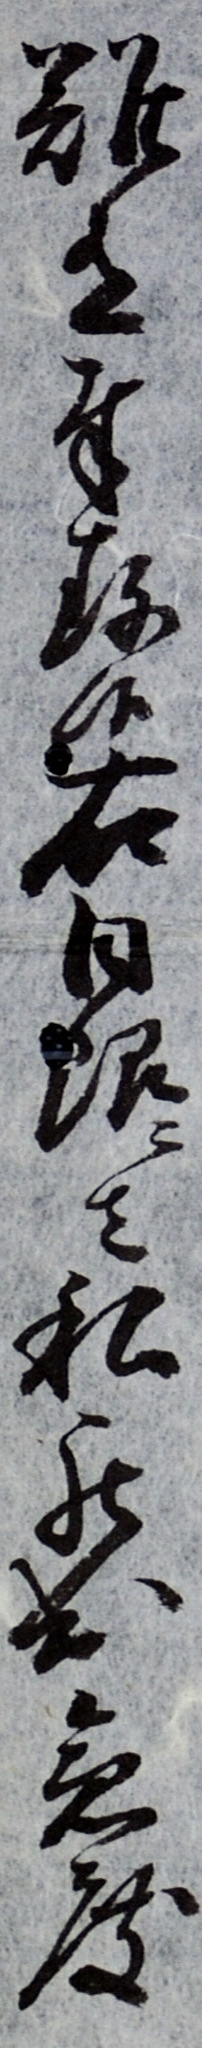難有奉存候右日限ニ者私罷出急度
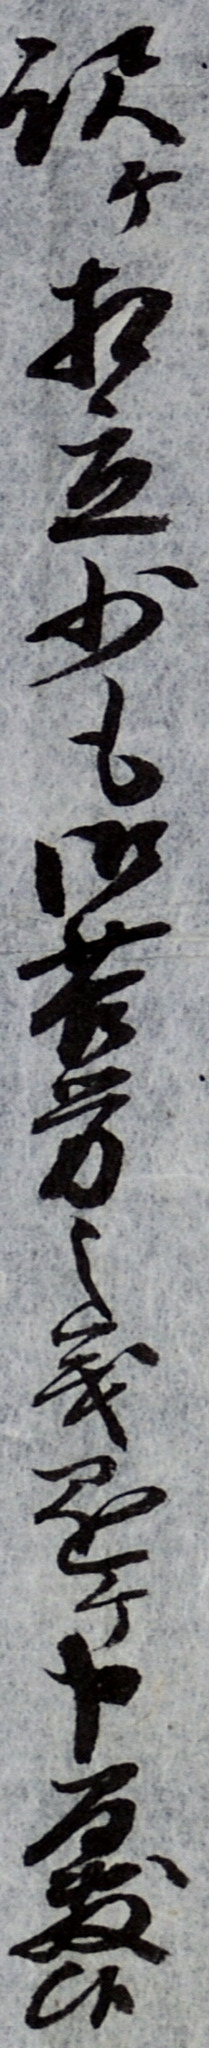訳ケ相立少も御苦労之義懸ケ申間敷候
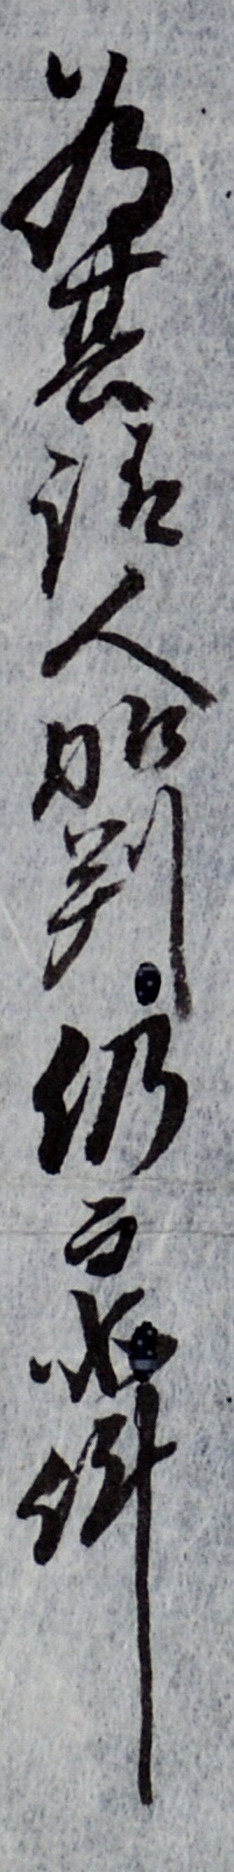為其請人加判仍而如件
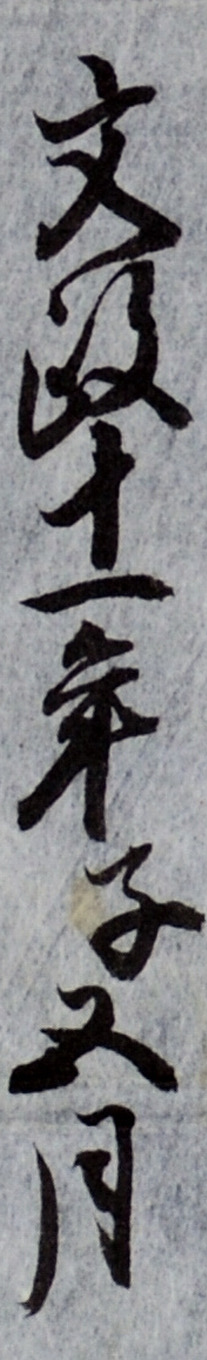文政十一年子五月
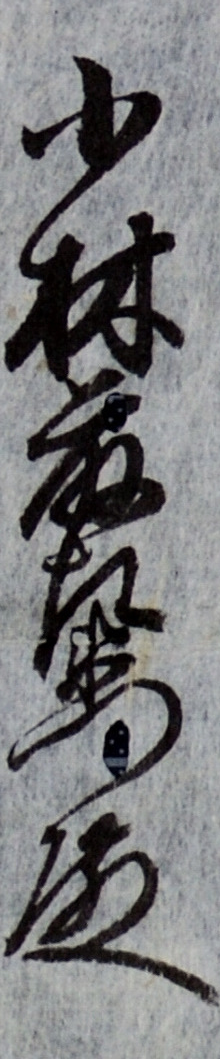小林藤左衛門殿
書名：一札之事
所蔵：伊那市立高遠町図書館・合同会社AMANE
